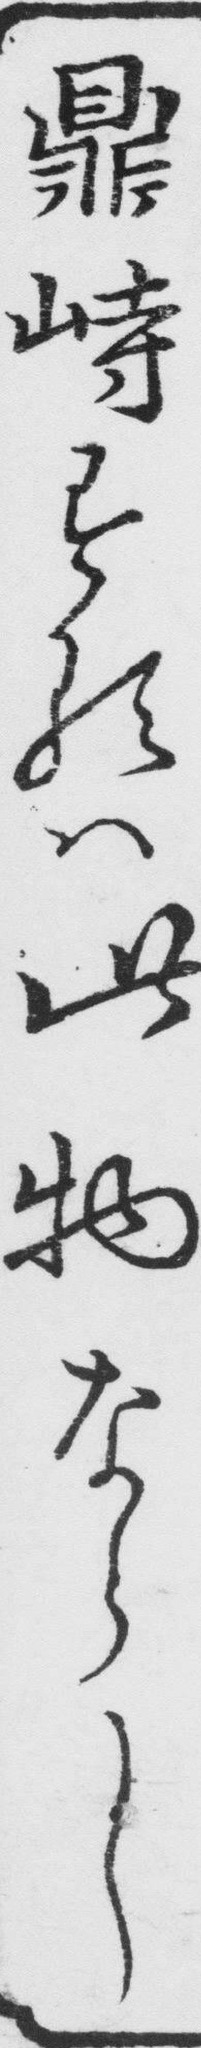鼎峙するは此物ならし

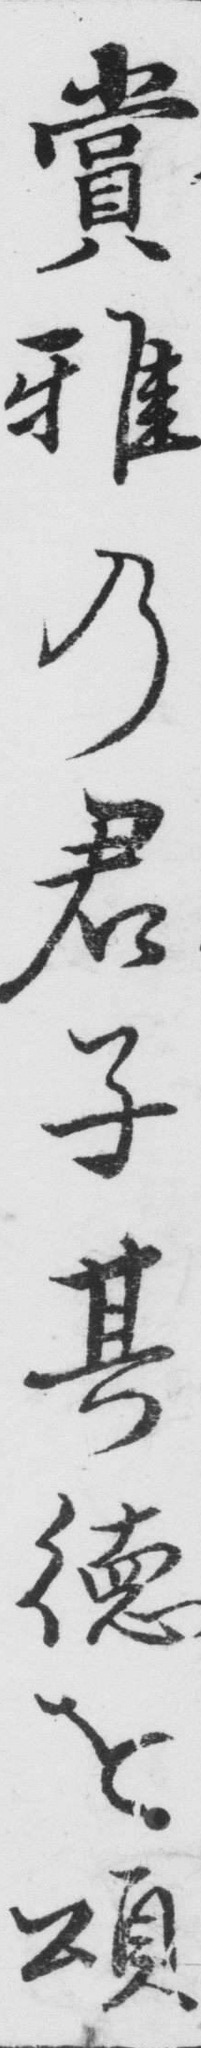賞雅の君子其徳を頌
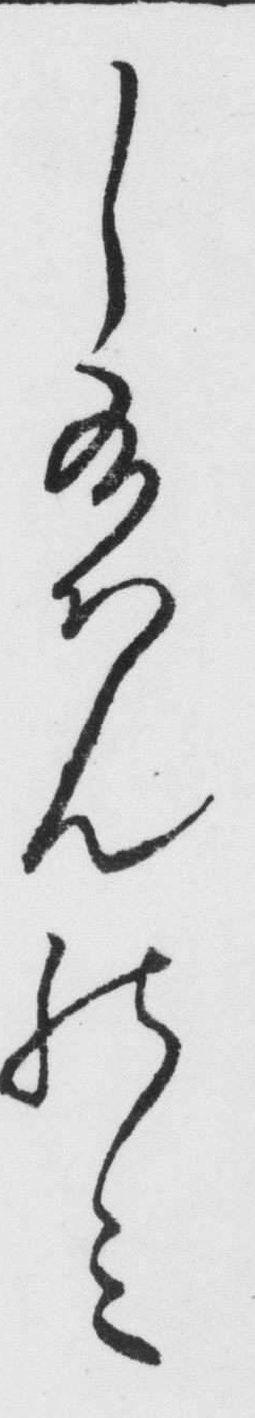し給はんのみ
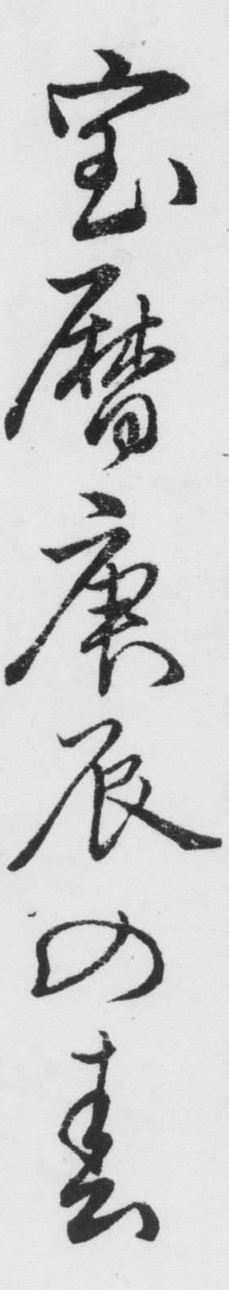宝暦庚辰の春
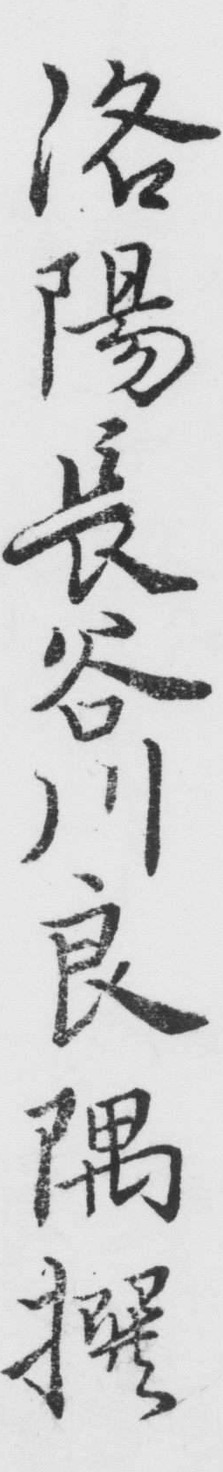洛陽長谷川良隅撰
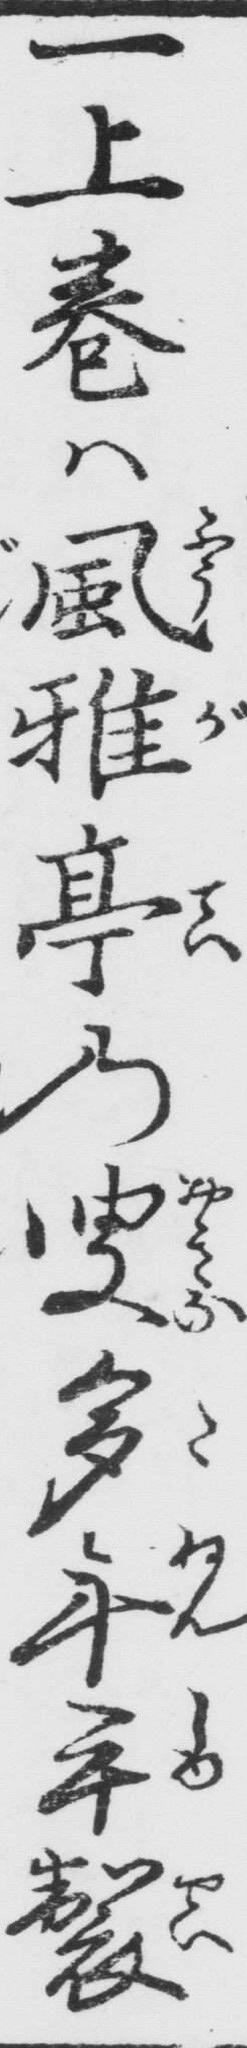一上巻は風雅亭の叟多年手製
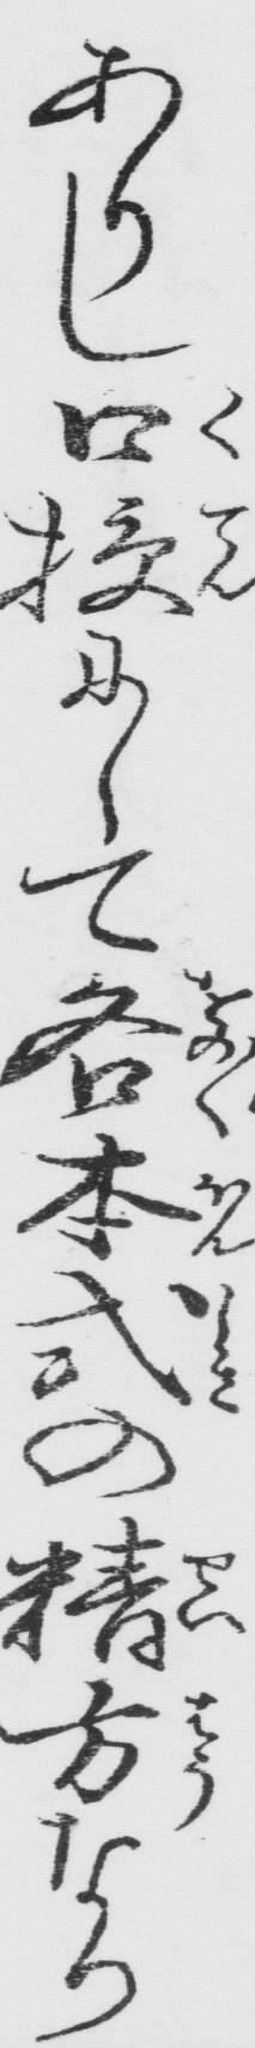ありし口授にして各本式の精方なり
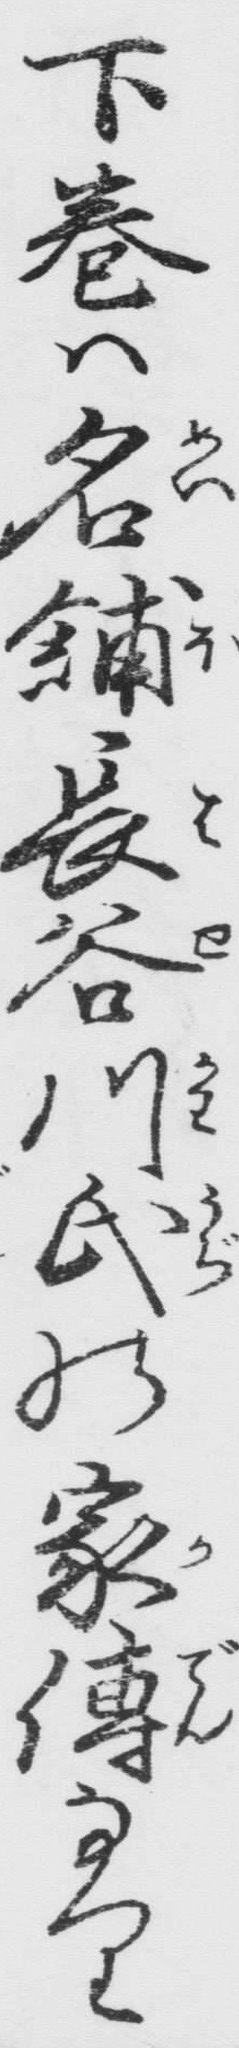下巻は名舗長谷川氏の家伝なり
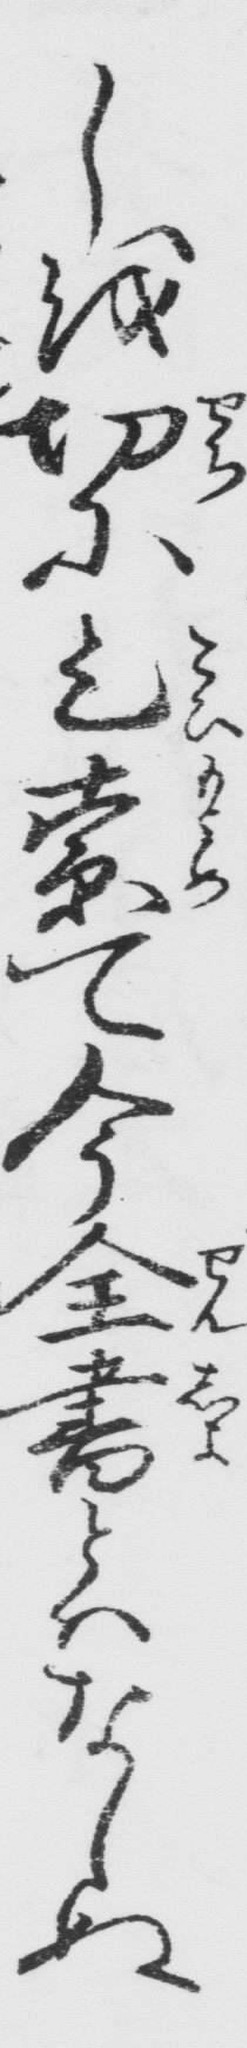しを切に乞索て今全書とはなしぬ
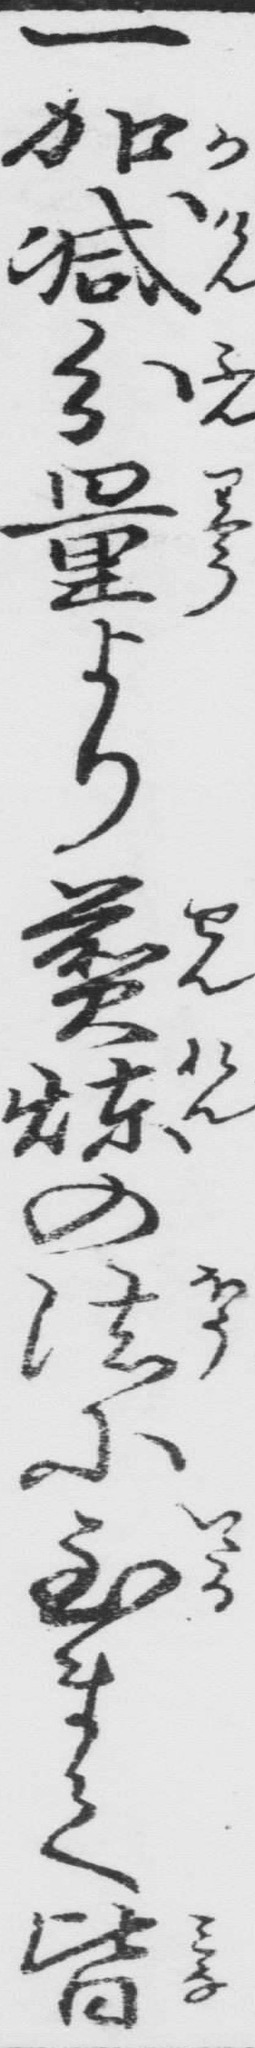一加減分量より煎煉の法に至まて皆
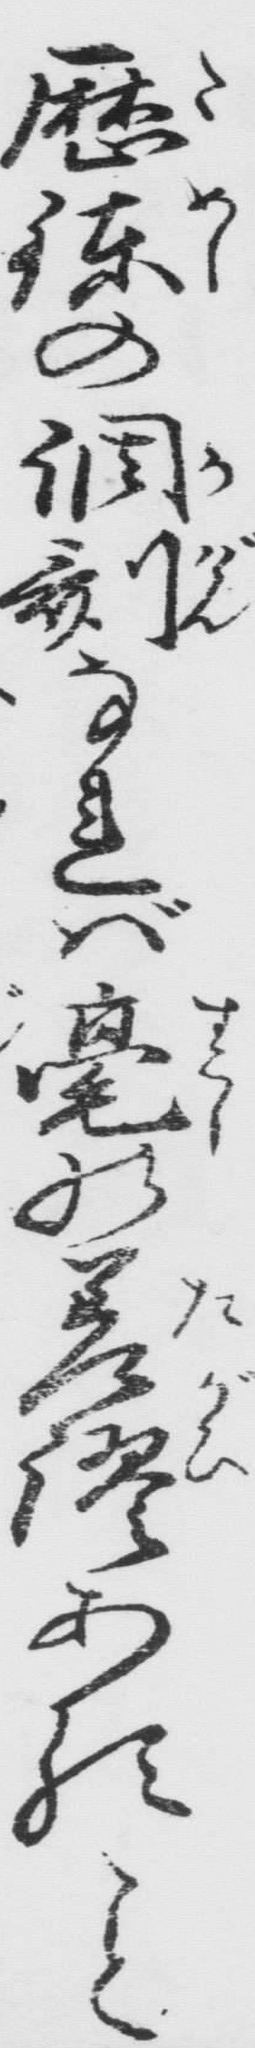歴錬の調剤なれば毫の差謬あること
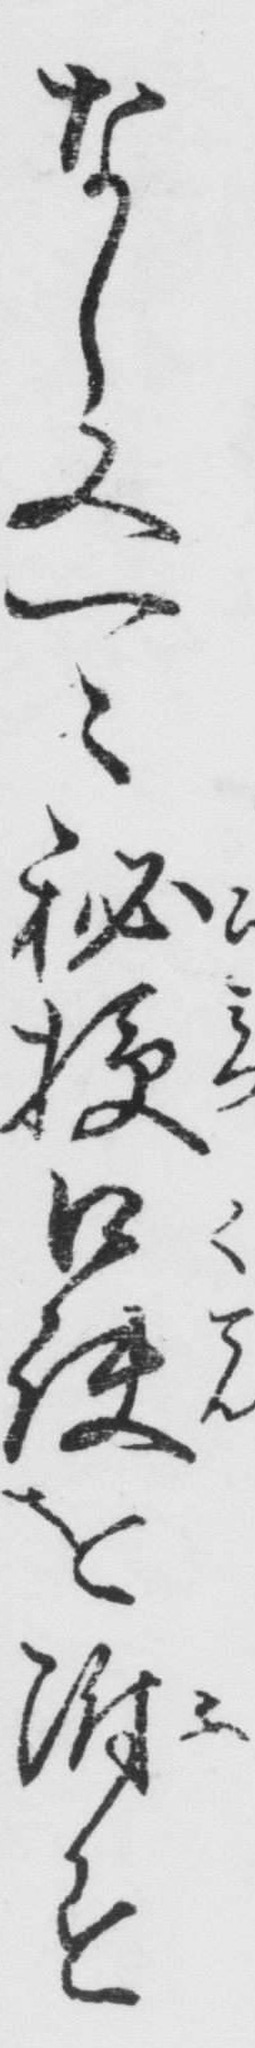なし又一々秘授口訣を附す

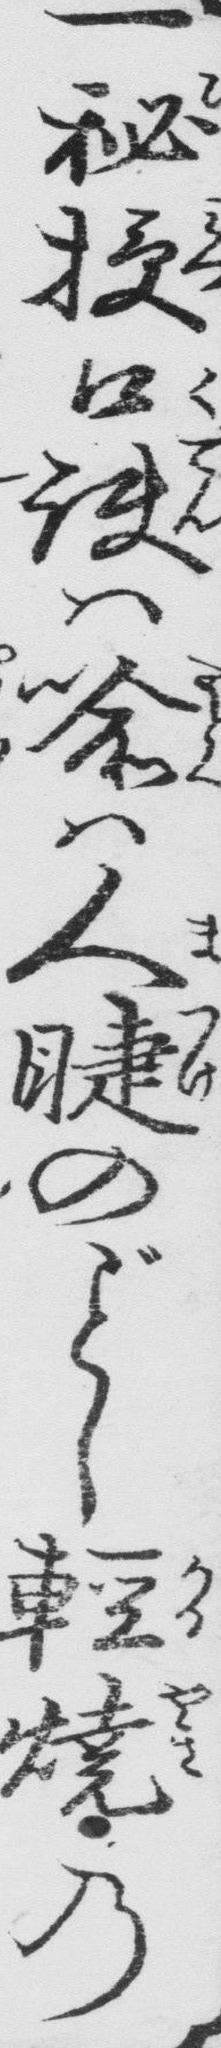一秘授口訣は喩は人睫のごとし軽焼の
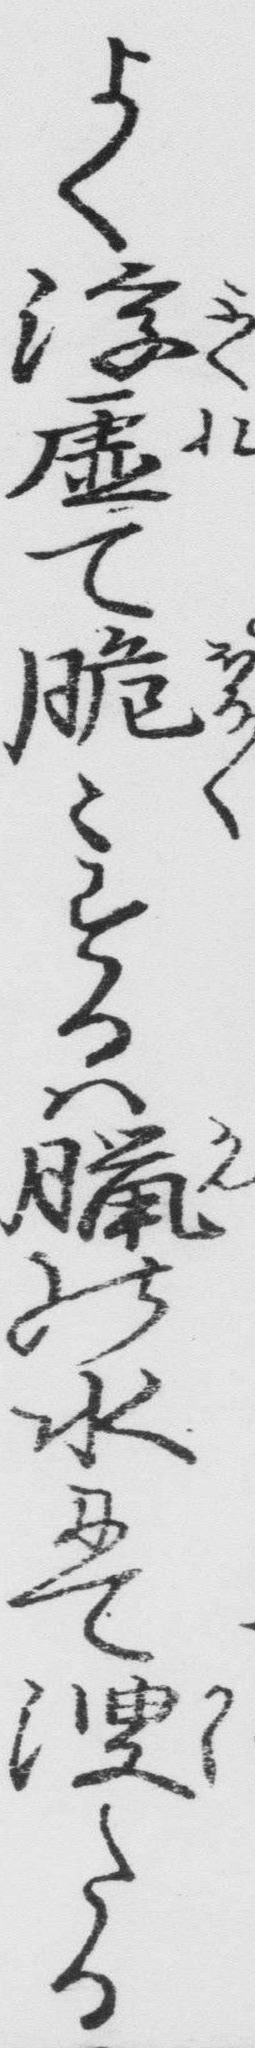よく浮虚て脆々するは臘の水にて溲たる
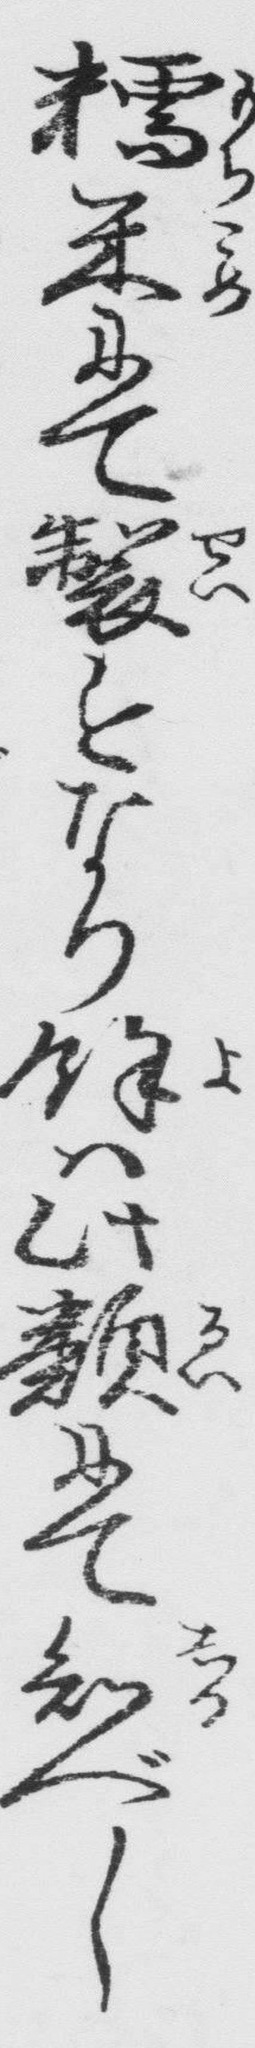糯米にて製すなり餘は此類にて知べし
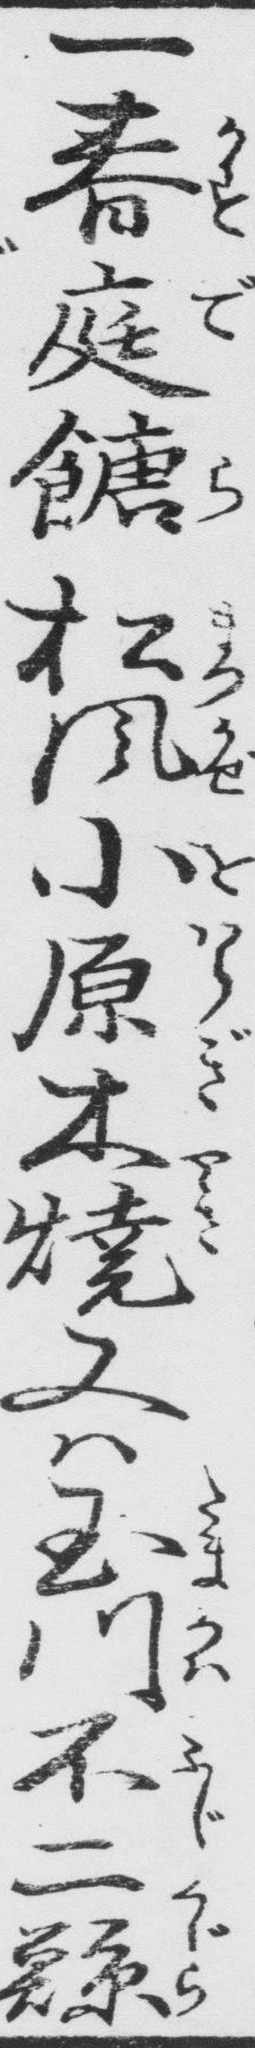一春庭餹松風小原木焼又は玉川不二鯨
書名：御前菓子図式
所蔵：大阪府立大学学術情報センター 国文学研究資料館
